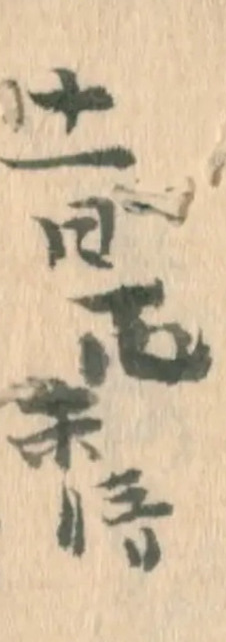十一日乙未晴
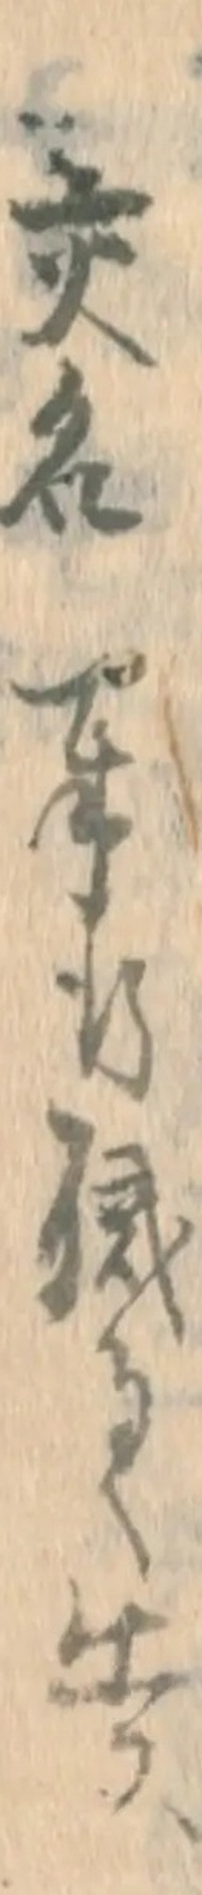交名奉行職事へ出ス
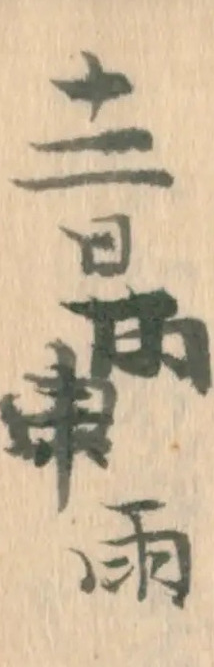十二日丙申雨
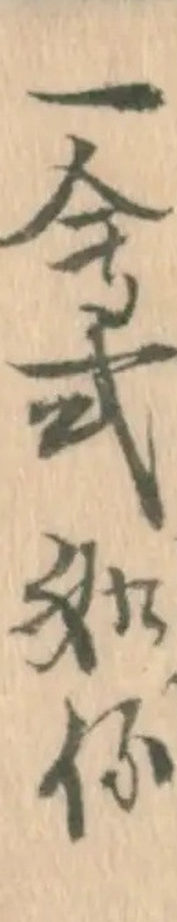一会式如例
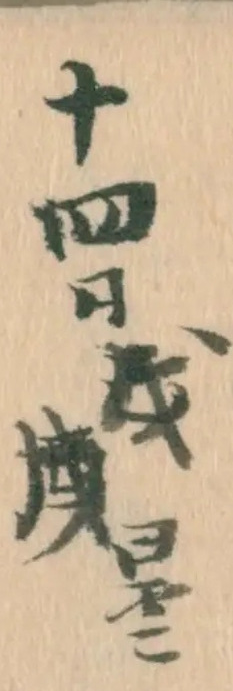十四日戊戌曇
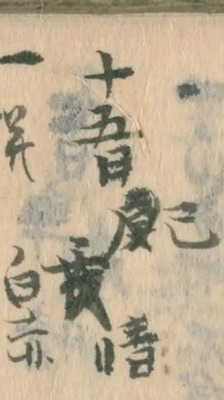十五日己亥晴
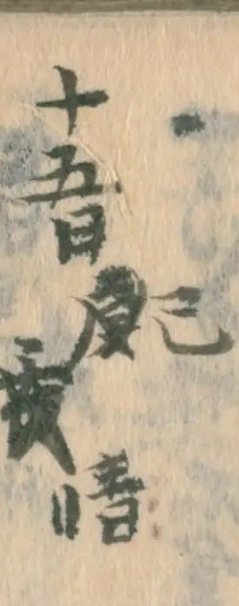十五日己亥晴
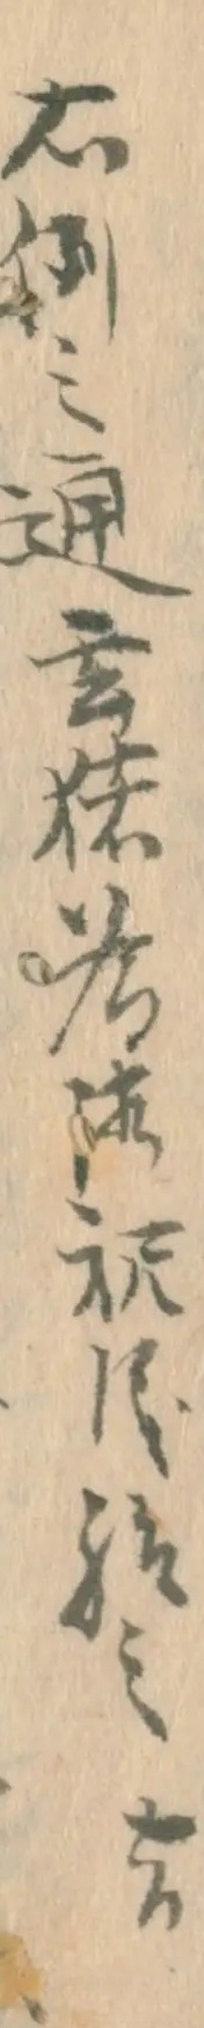右例之通玄猪為御祝儀給之旨
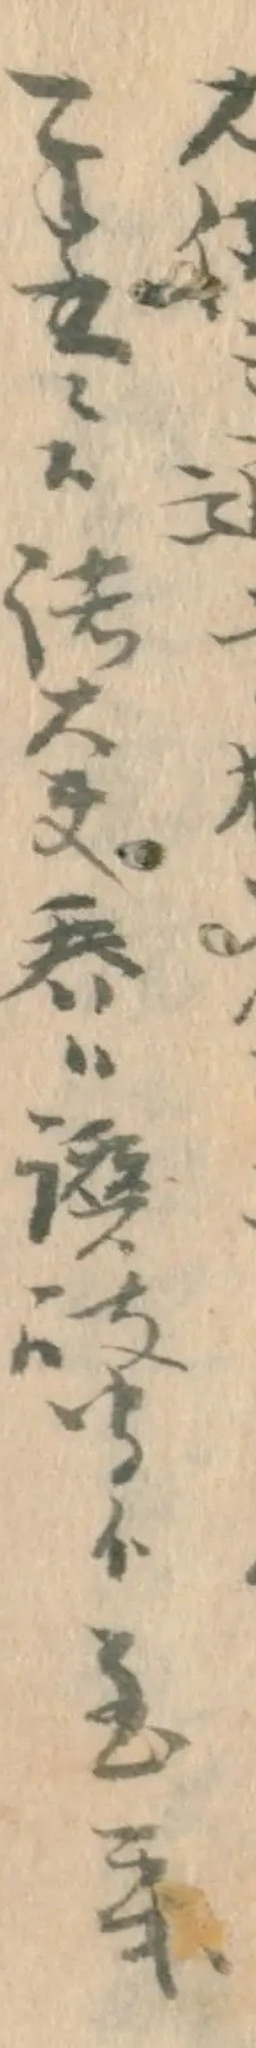奉書ニ而諸大夫春日讃岐守ゟ到来
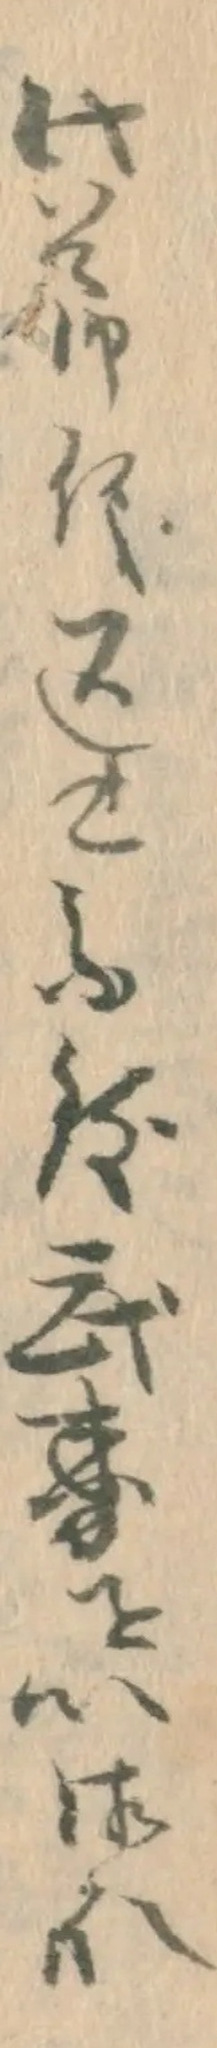此節儀返書不致武寿を以御礼
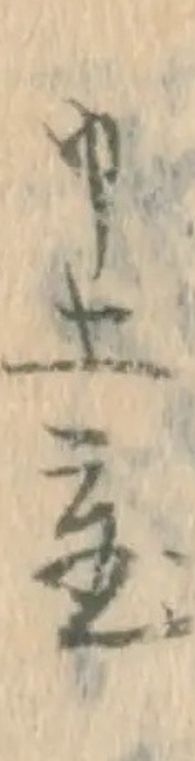申上置
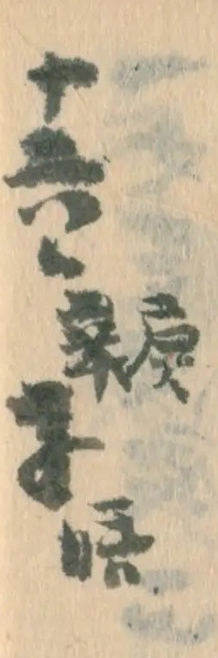十六日庚子晴

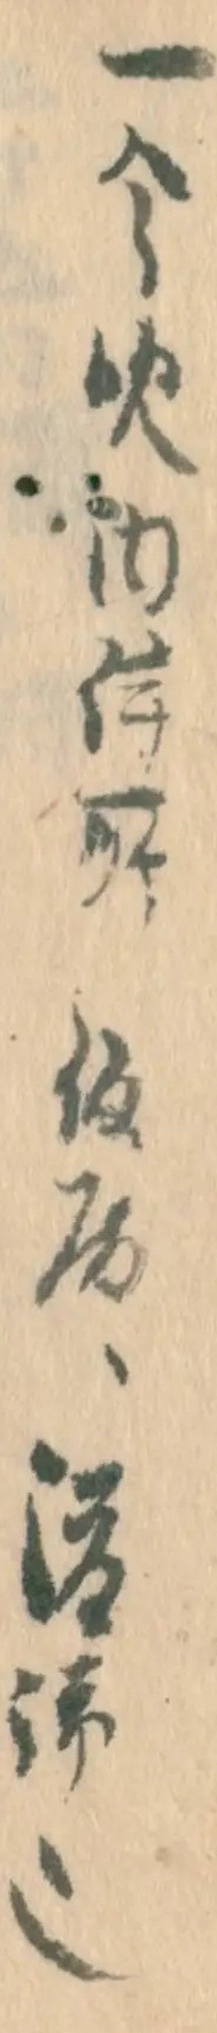一今晩内侍所仮殿へ渡御也
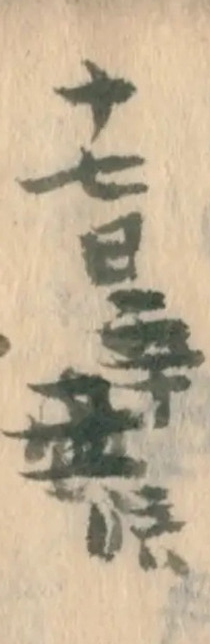十七日辛丑晴
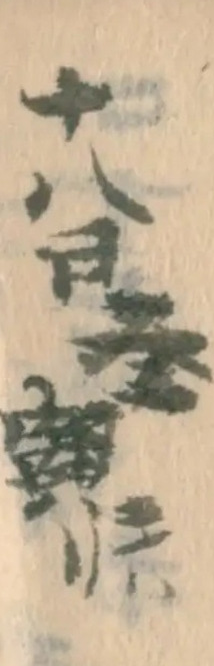十八日壬寅晴
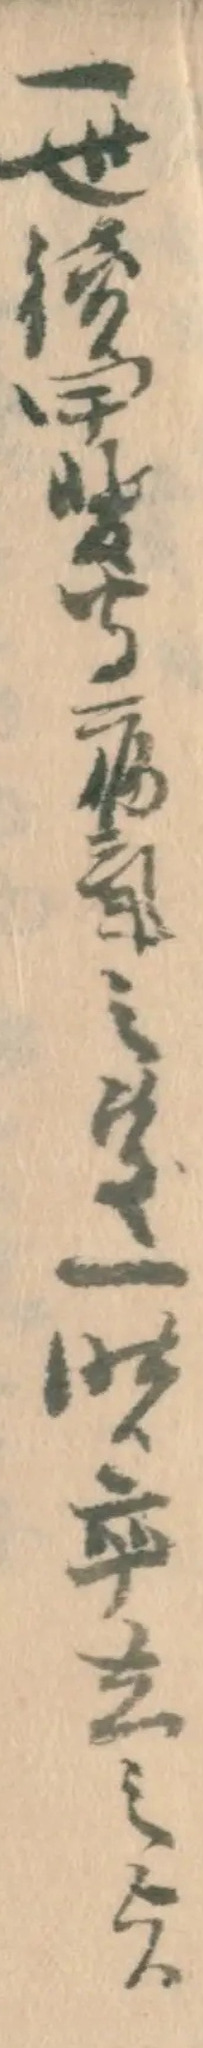一世続甲斐守病気之処一昨日卒去之旨
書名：禁裏御所御用日記. [131]
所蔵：国立国会図書館 National Diet Library, JAPAN
